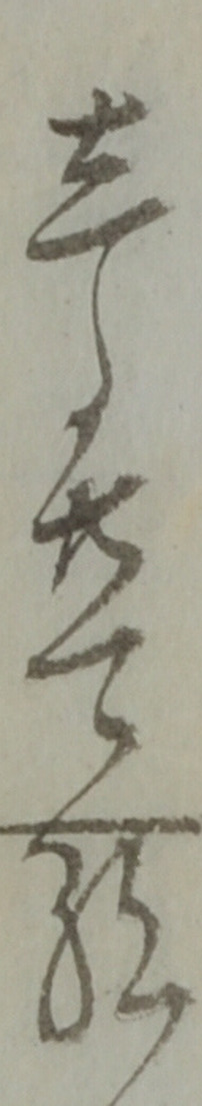十月廿一日
